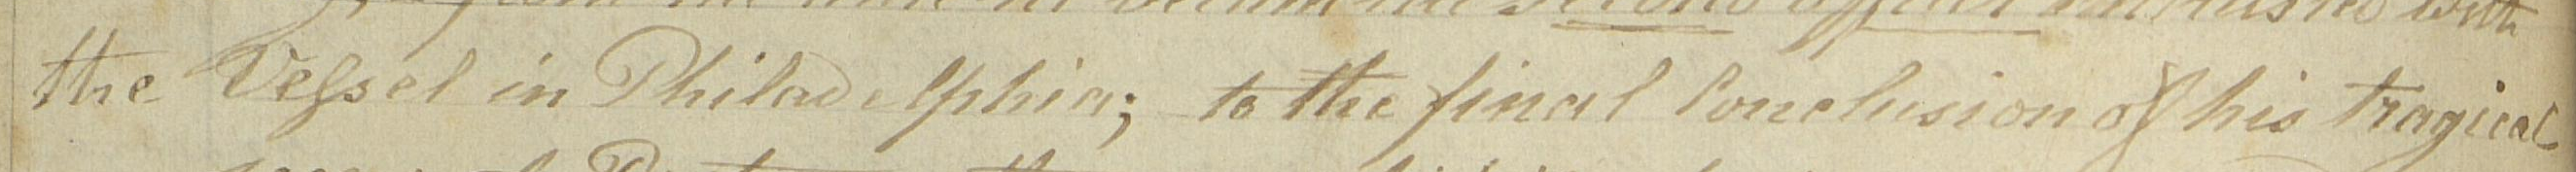the Vessel in Philadelphia; to the final Conclusion of his tragical
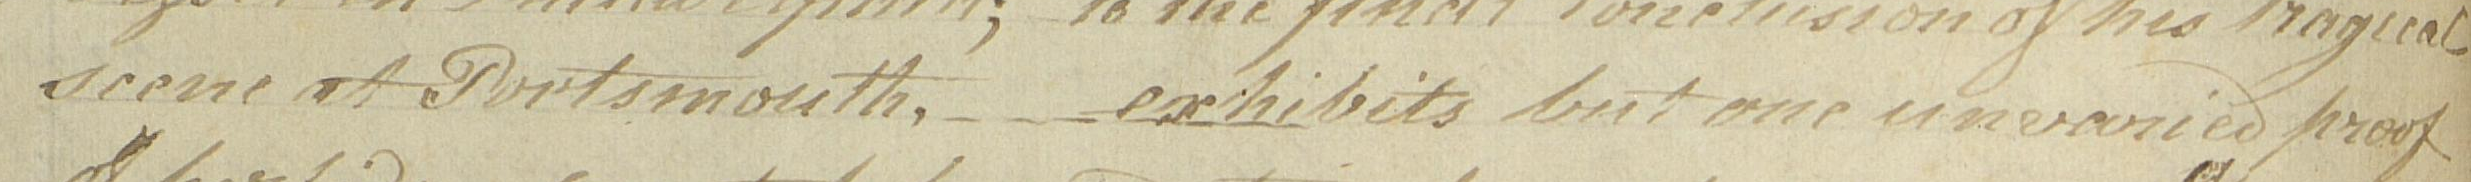scene at Portsmouth, exhibits but one unvaried proof
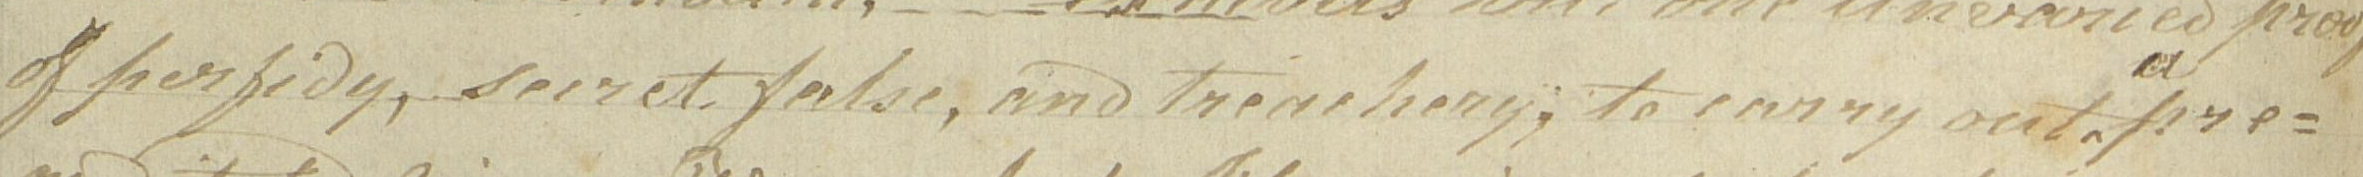& perfidy, secret false, and treachery; to carry out ^ pro-
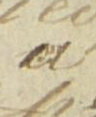a
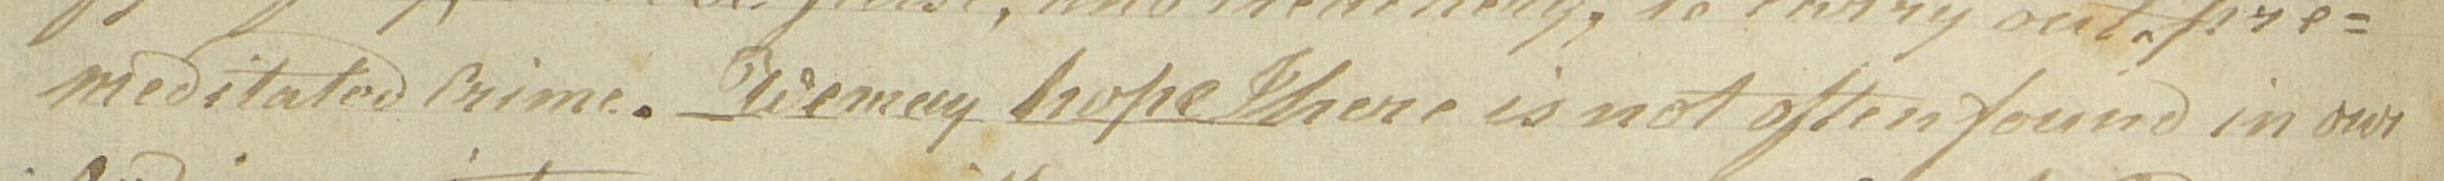meditated Crime. We may hope There is not often found in our
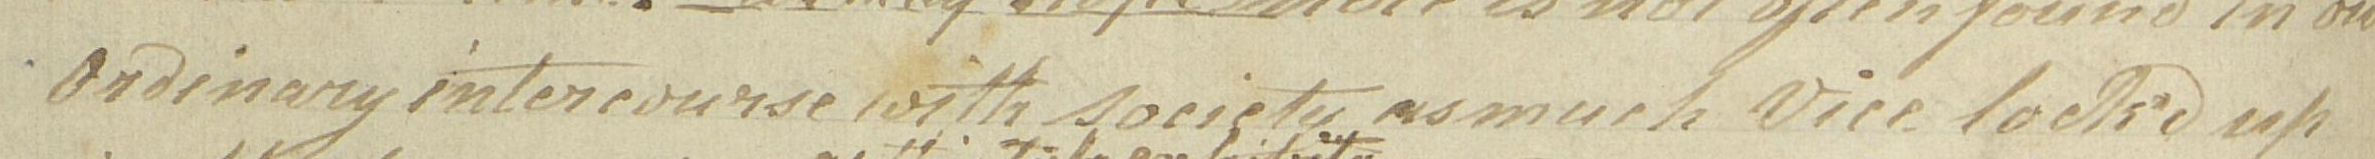Ordinary intercourse with society as much Vice lock'd up
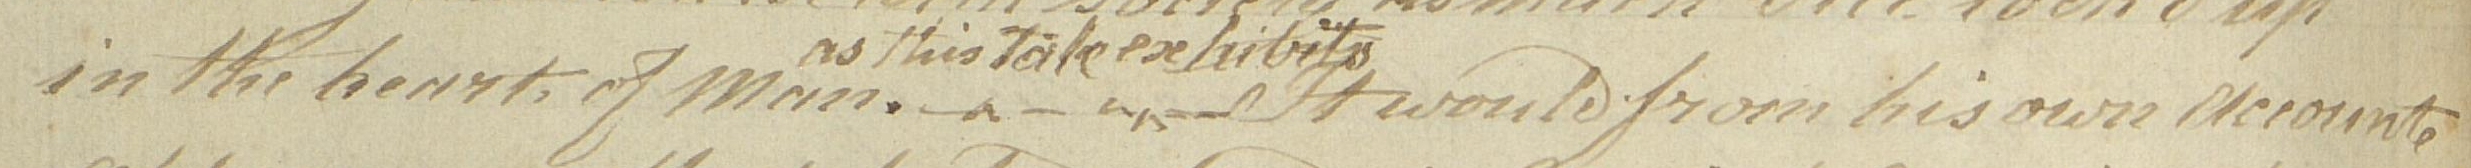in the heart of Man. ^ ^ It would from his own account
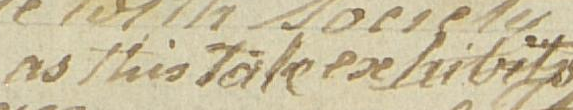as this take exhibits
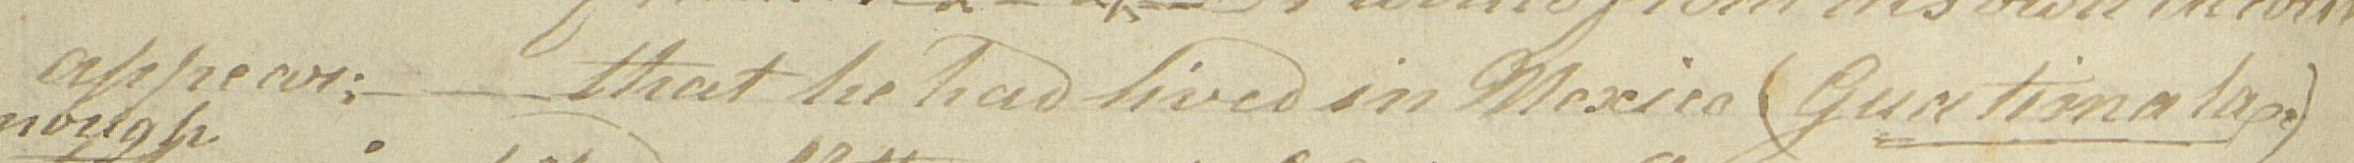appear: that he had lived in Mexico Guatimala.)
